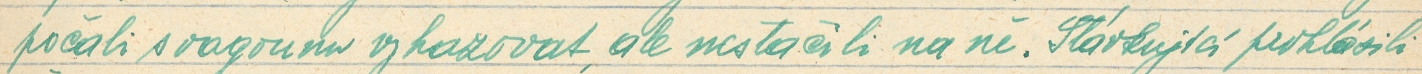počali s vagounu vyhazovat, ale nestačili na ně. Stávkující prohlásili
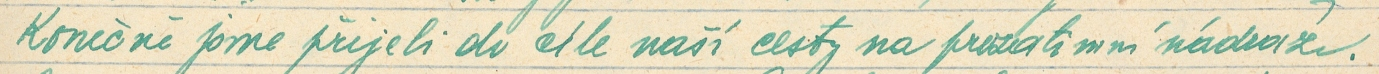Konečně jsme přijeli do cíle naší cesty na prozatimní nádraží.
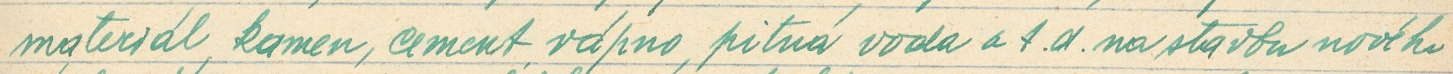materiál, kamen, cement, vápno, pitná voda a t. d. na stavbu nového
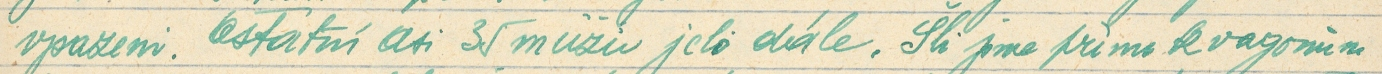vysazeni. Ostatní asi 35 mužů jeli dále. Šli jsme přímo k vagonům
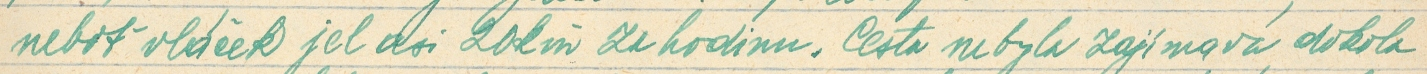neboť vláček jel asi 20 km za hodinu. Cesta nebyla zajímavá, dokola
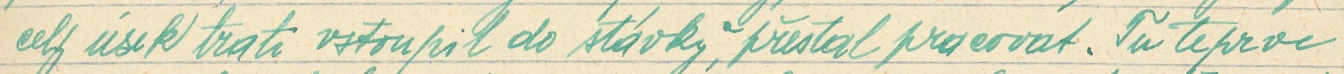celý úsek trati vstoupil do stávky, přestal pracovat. Tu teprve
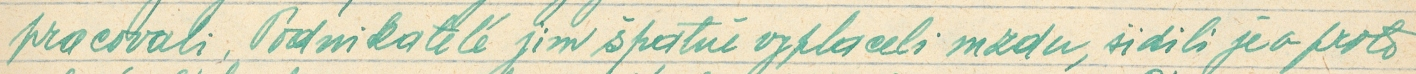pracovali, Podnikatelé jim špatně vyplaceli mzdu, šidili je a proto
